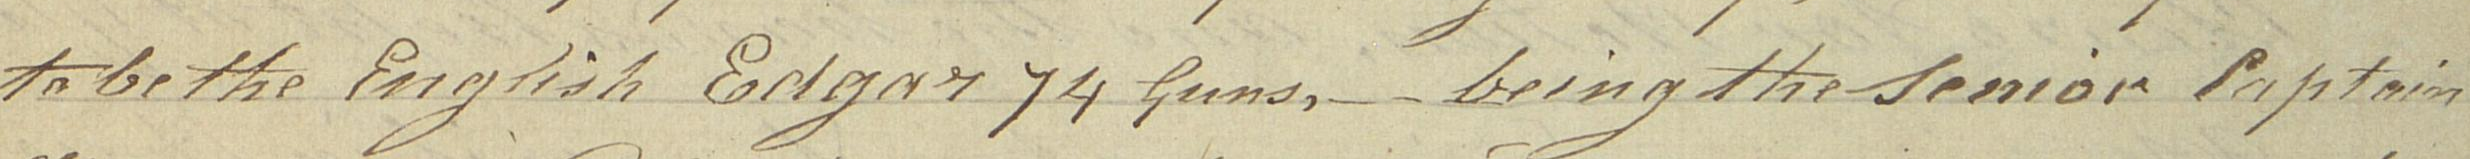to be the English Edgar 74 Guns, being the Senior Captain
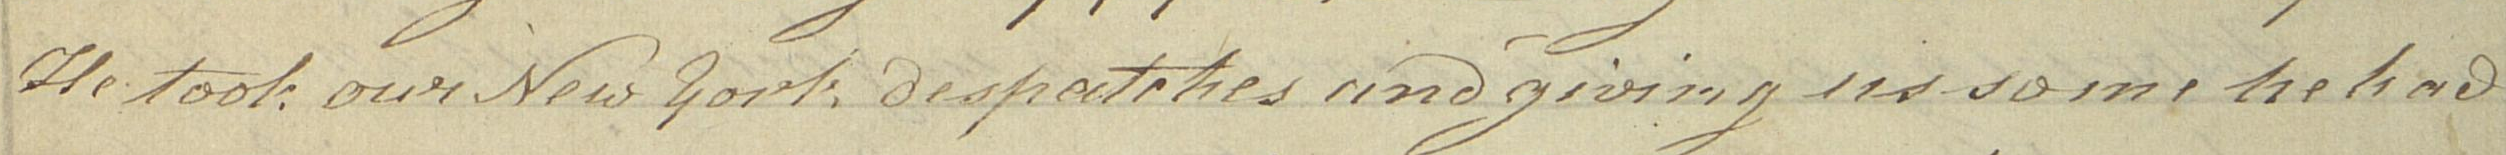He took our New York despatches and giving us some he had
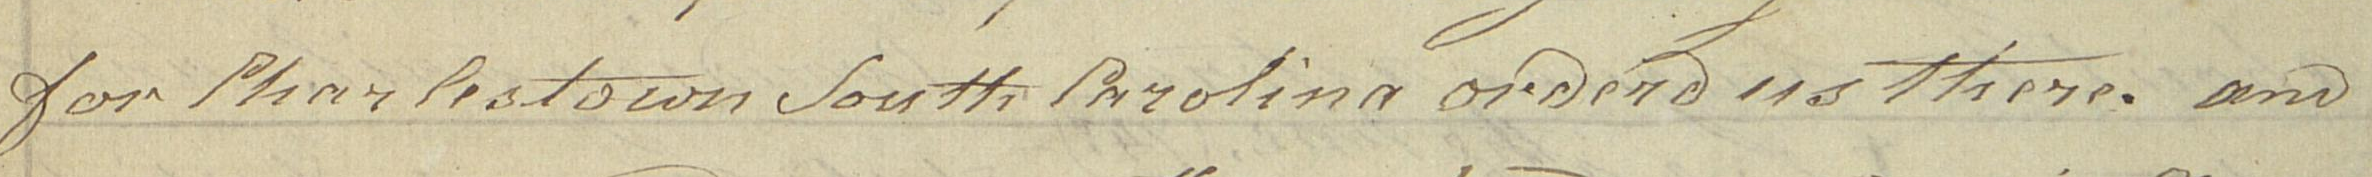for Charlestown South Carolina orderd us there, and
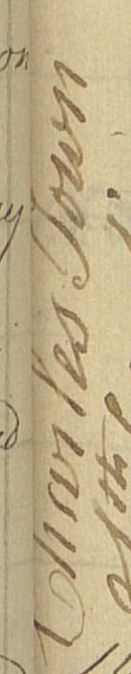Charles Town
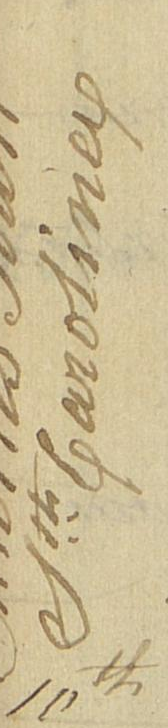S^th. Carolina
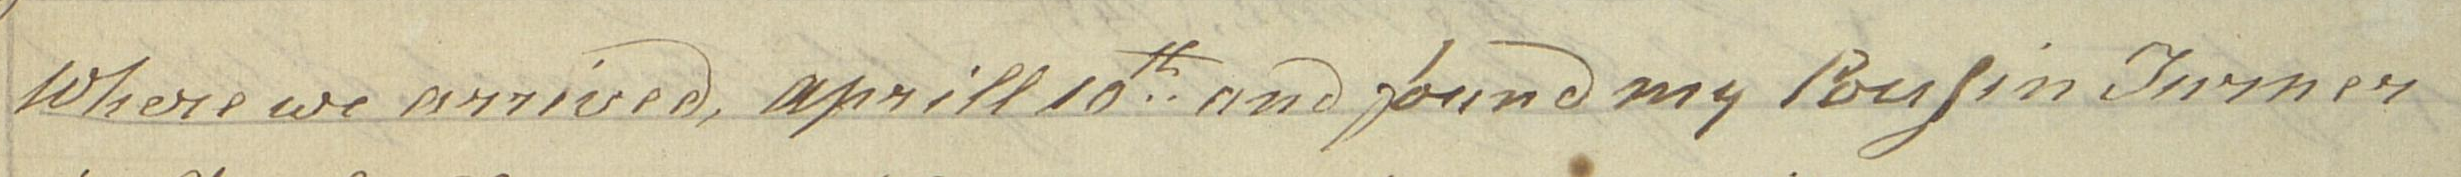Where we arrived, april 10^th. and found my Cousin Turner
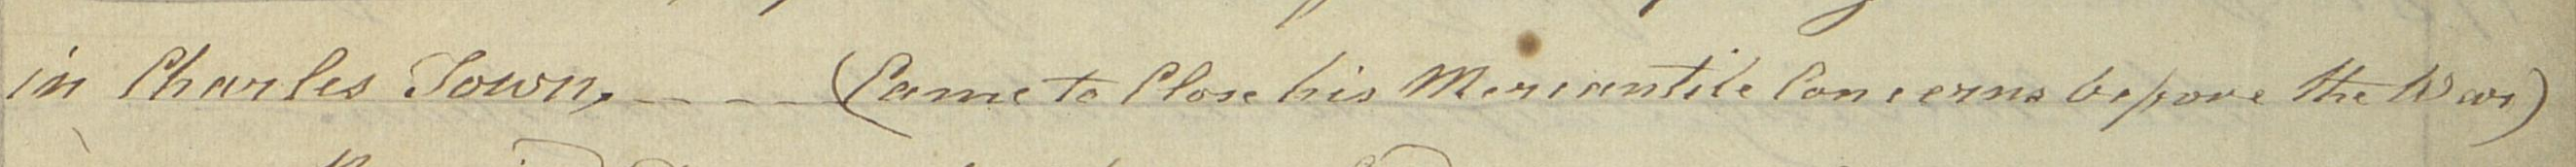in Charles Town, (Came to Close his Mercantile Concerns before the War)
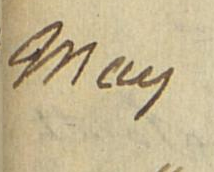May
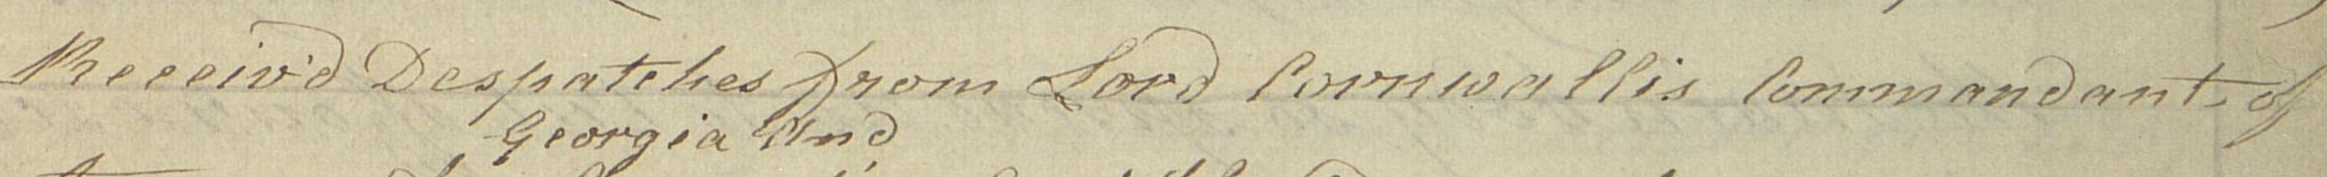Receiv'd Despatches from Lord Cornwallis Commandant of
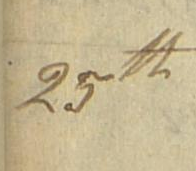25^th
